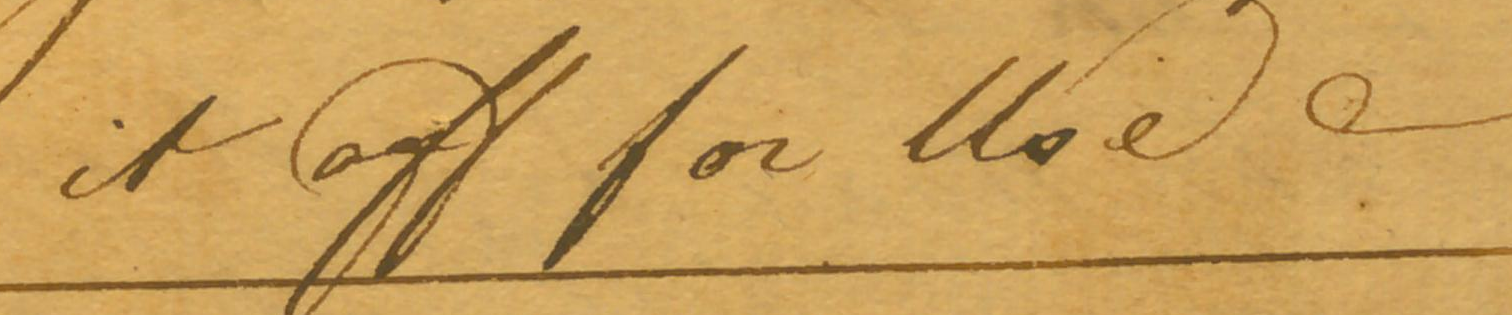it off for Use-
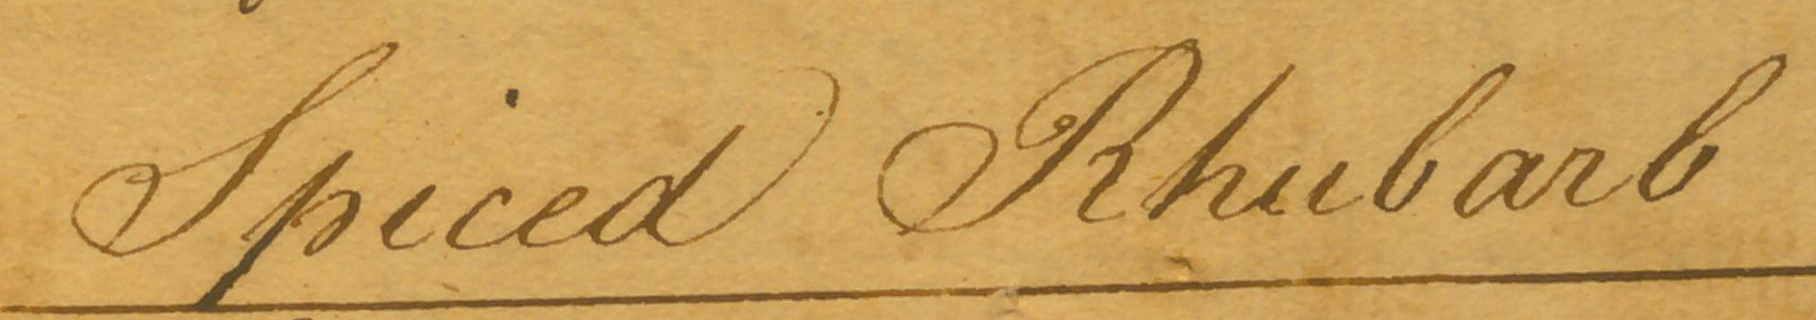Spiced Rhubarb
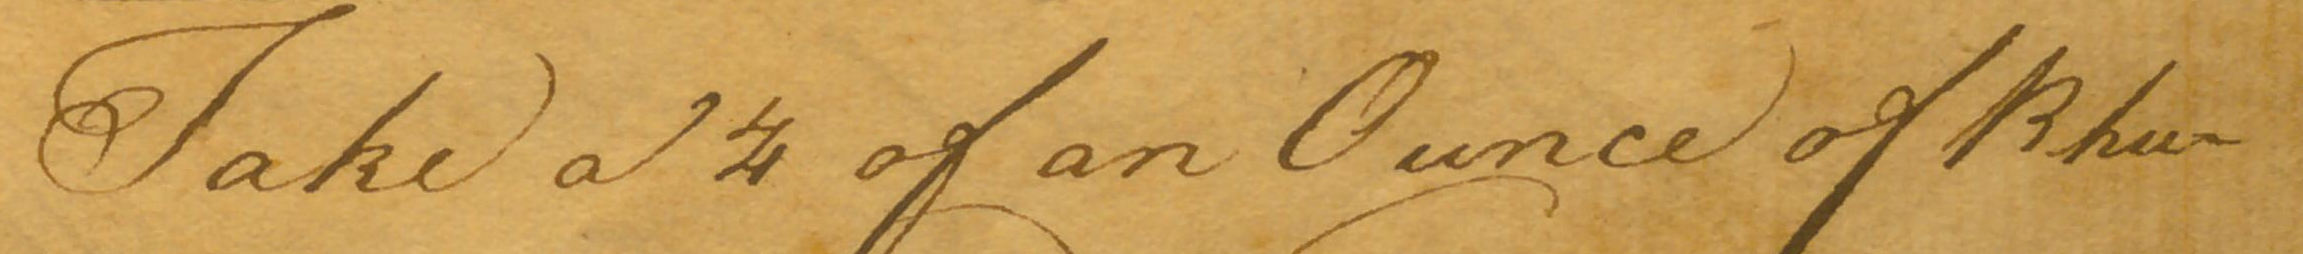Take a 1/4 of an Ounce of Rhu-
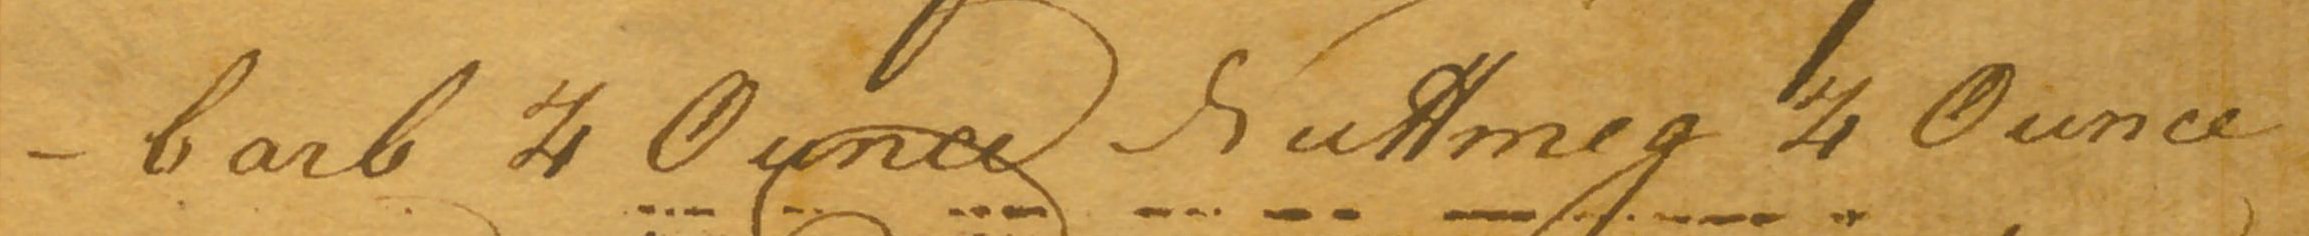-barb 1/4 Ounce Nuttmeg 1/4 Ounce
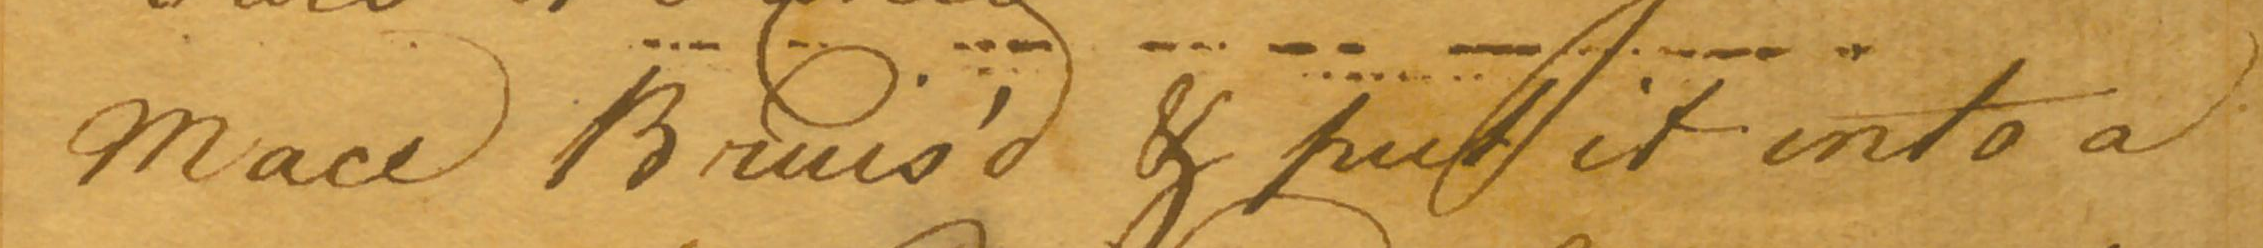mace Bruis'd & put it into a
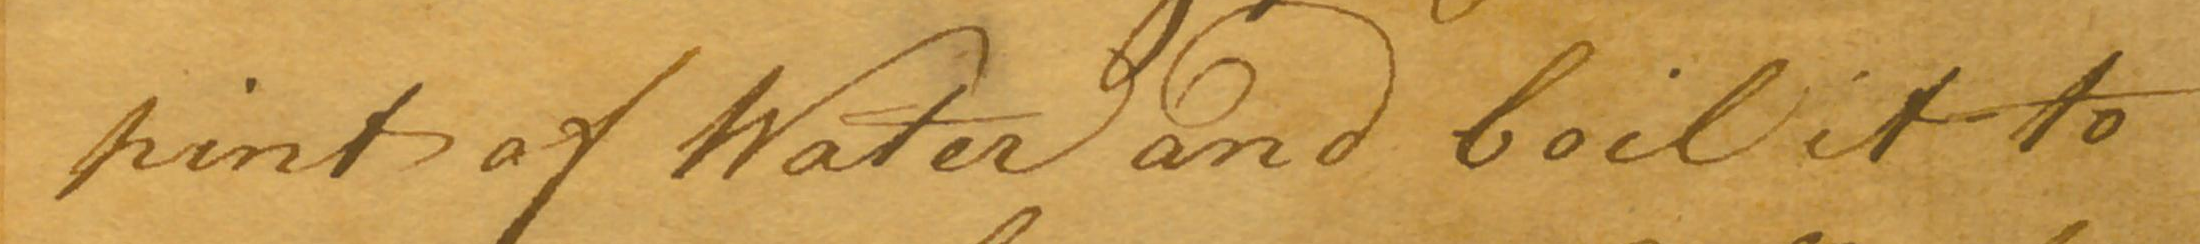pint of Water and boil it to
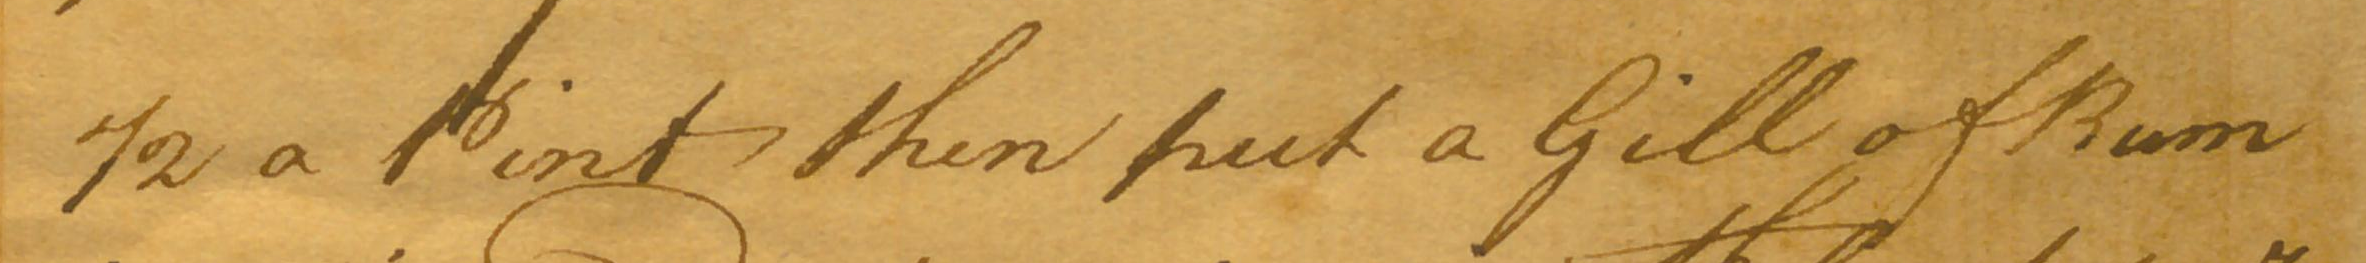1/2 a Pint then put a Gill of Rum
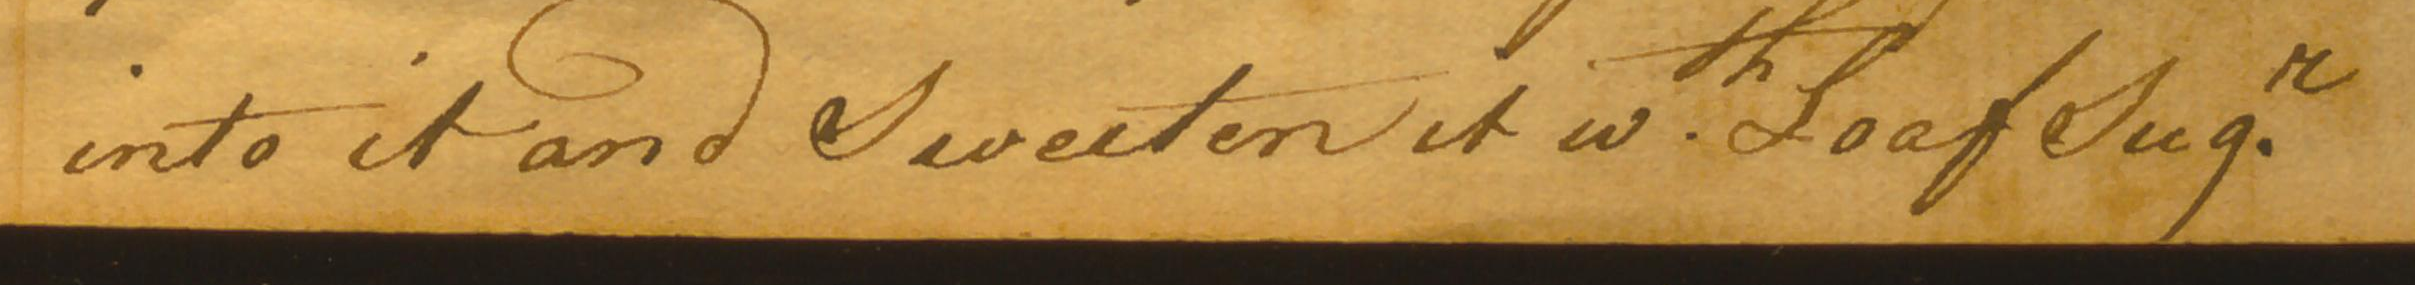into it and Sweeten it w^th. loaf Sug^r.
